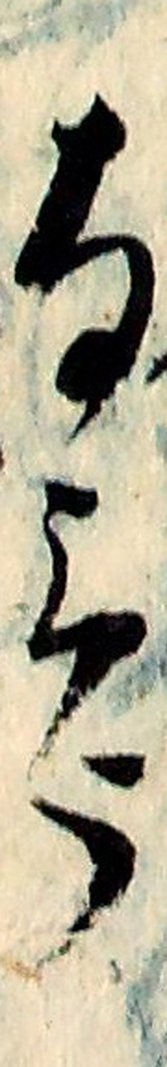与三郎
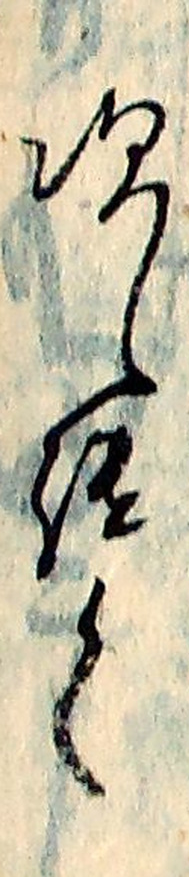次へ継く

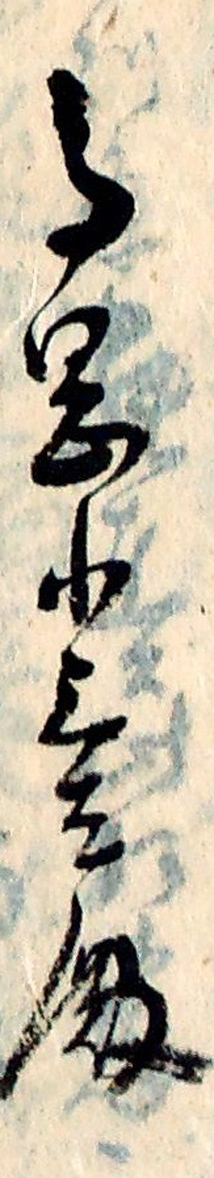高岡小三太殿
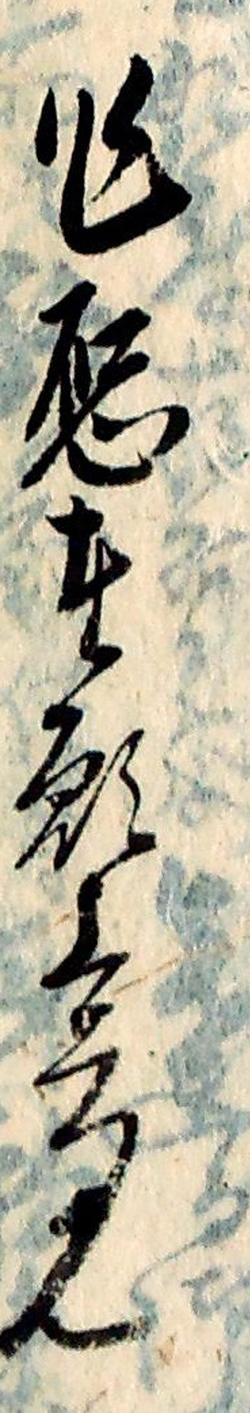乍恐奉願上覚
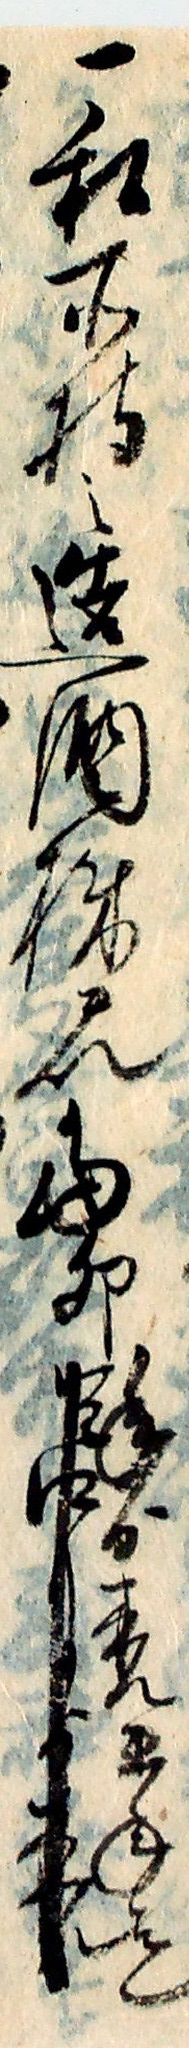一私所持之造酒株を以当卯年ゟ来る未年迄
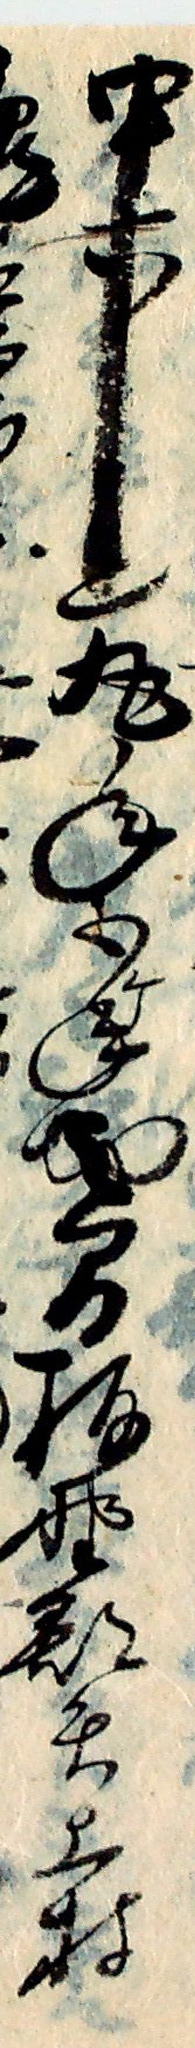申六月迄」丸年五ヶ年之間板野郡矢上村
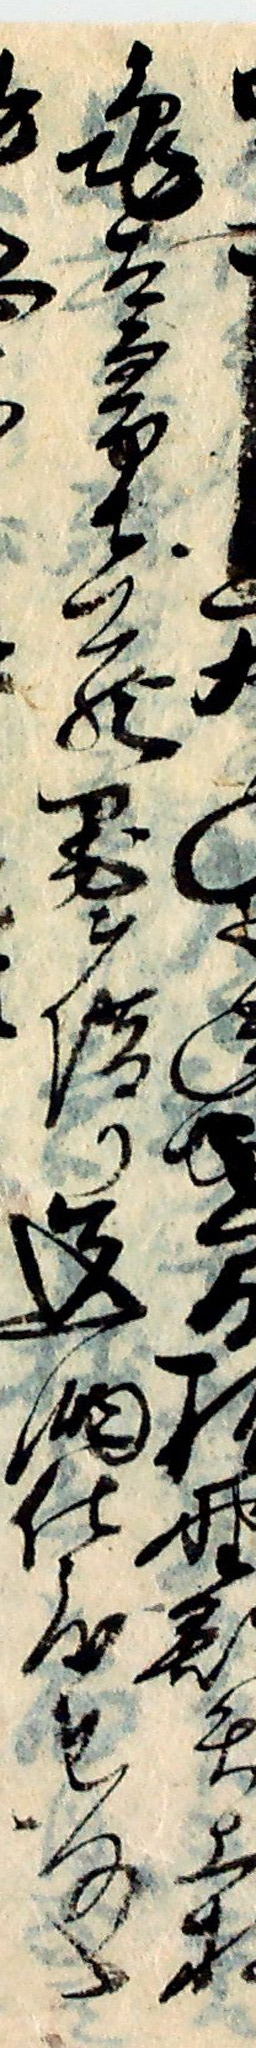亀太郎土蔵宅を借り造酒仕度奉存候
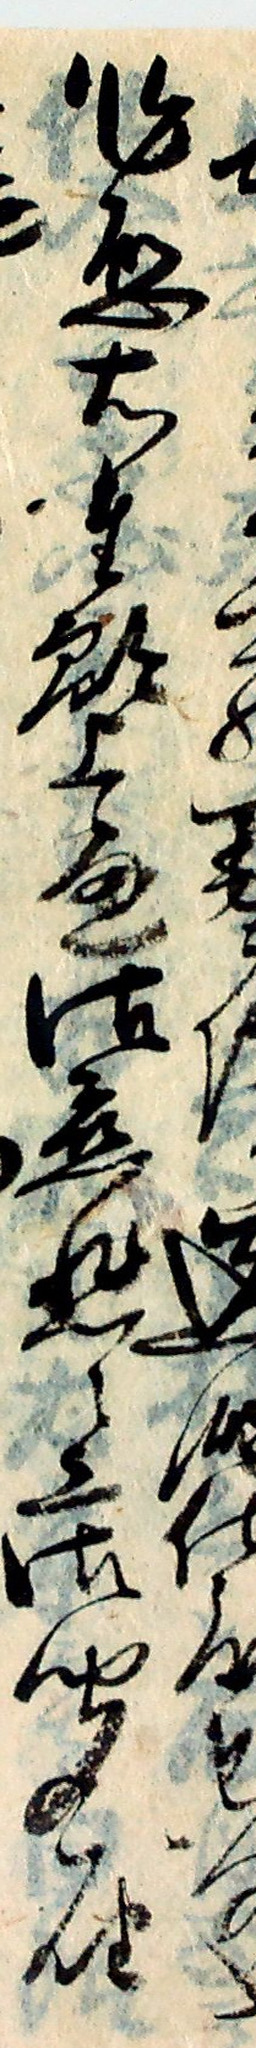乍恐右奉願上通御慈悲之上御聞届
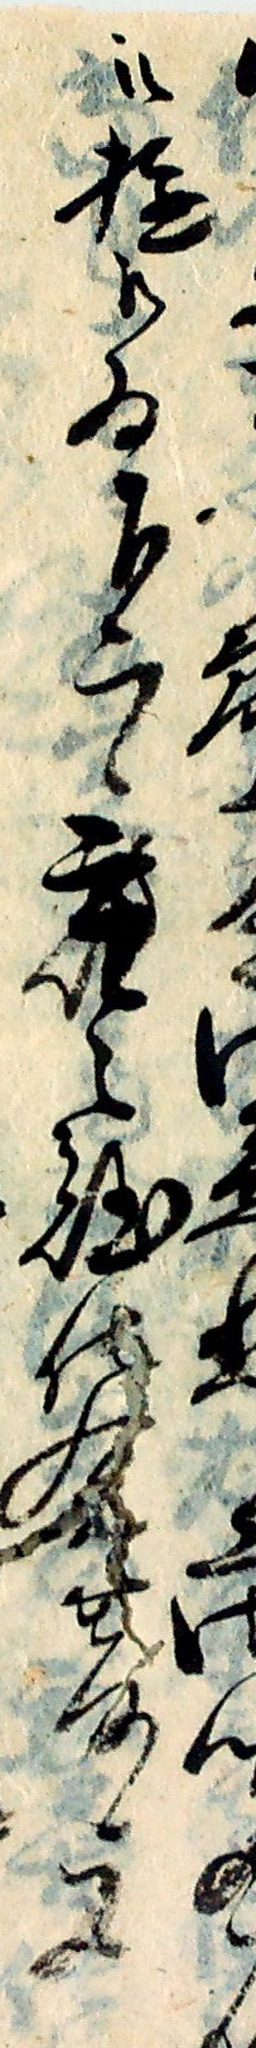被遊被為下候はゝ重々難仕合に奉存候以上
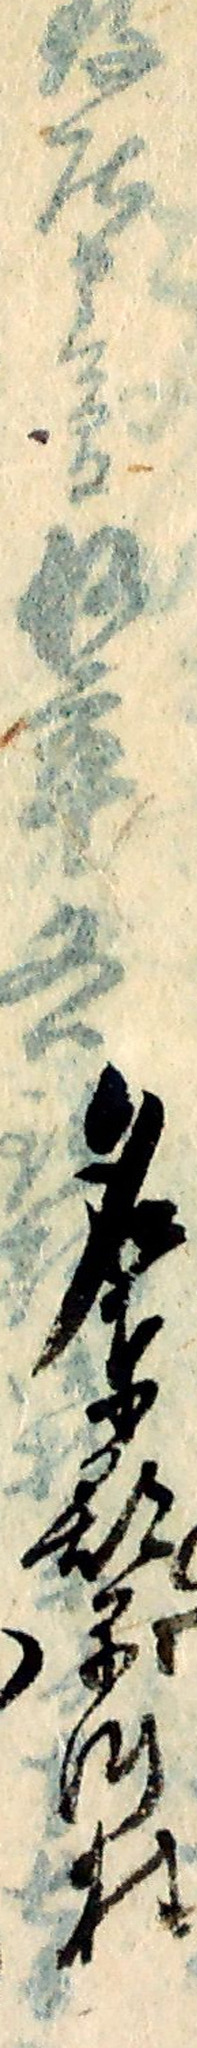名東郡早淵村
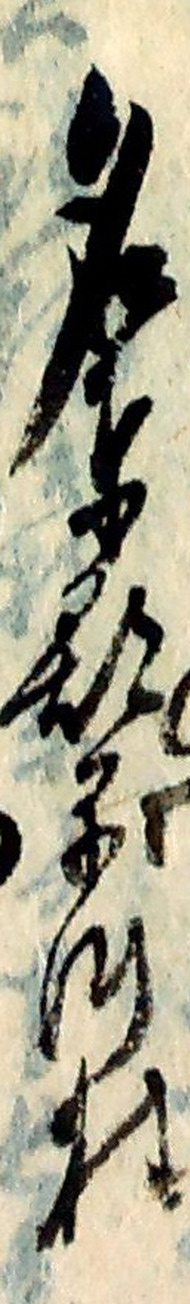名東郡早淵村
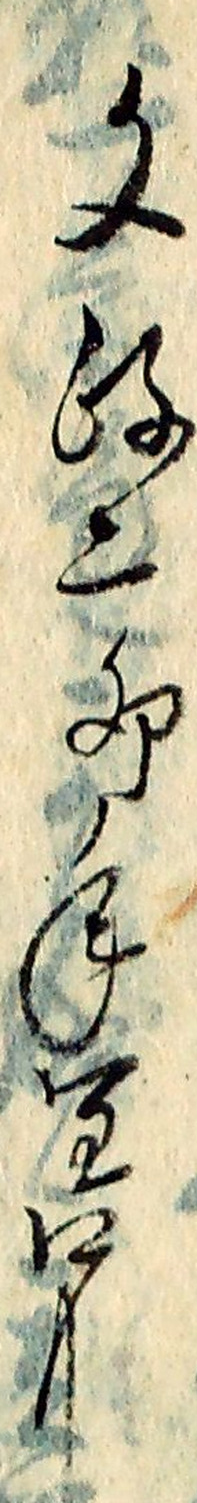文政二卯年閏四月
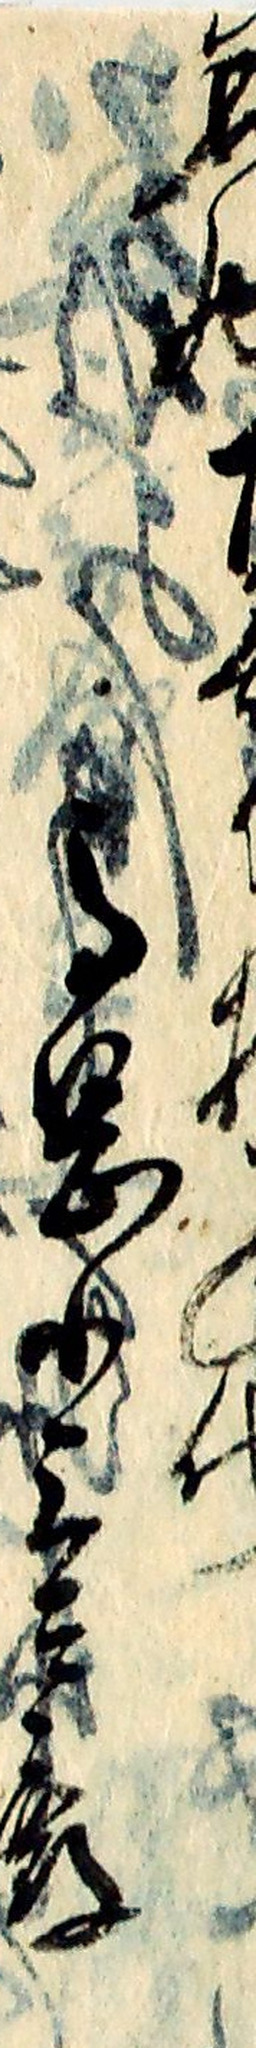高岡小三太殿
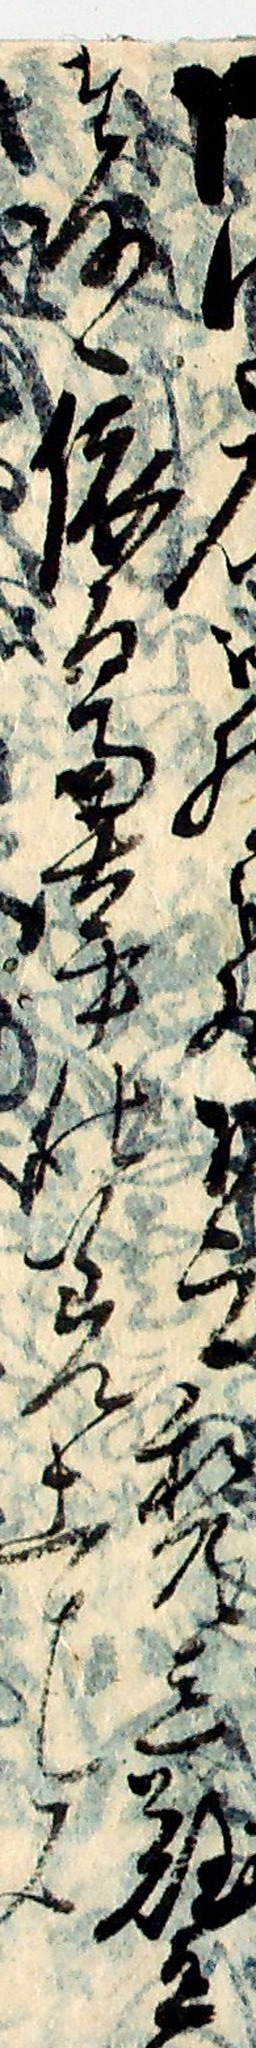奉存候依て奥書仕差上申候以上
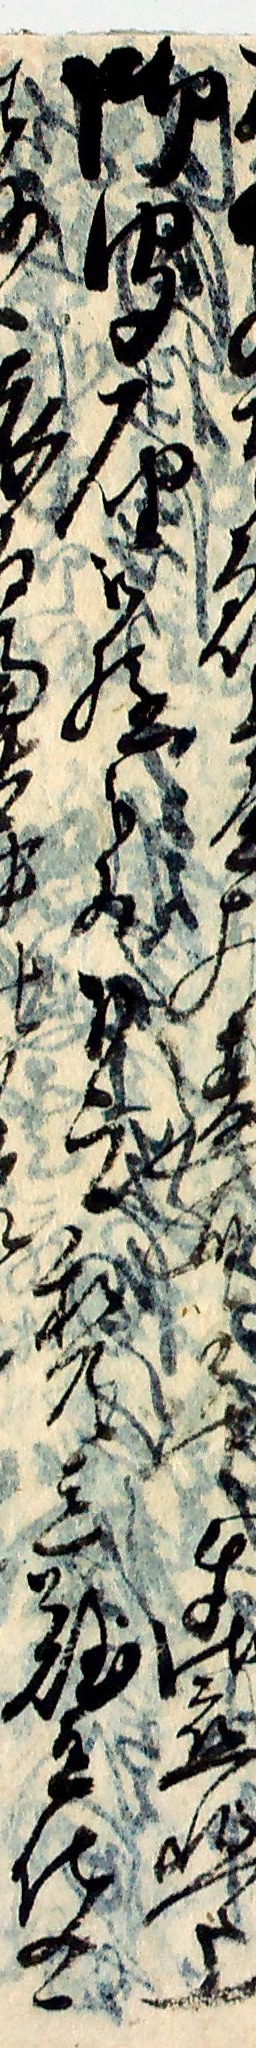御聞届被遊被為下候はゝ私共迄難有仕合
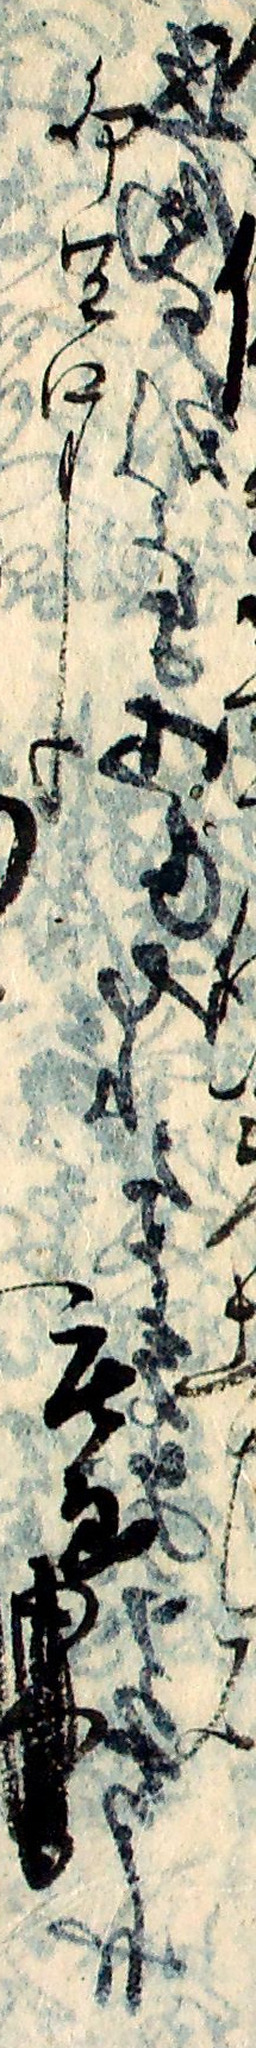卯閏四月庄屋
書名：諸御願書控(後藤氏壱番）
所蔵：鳴門教育大学 Naruto University of Education
